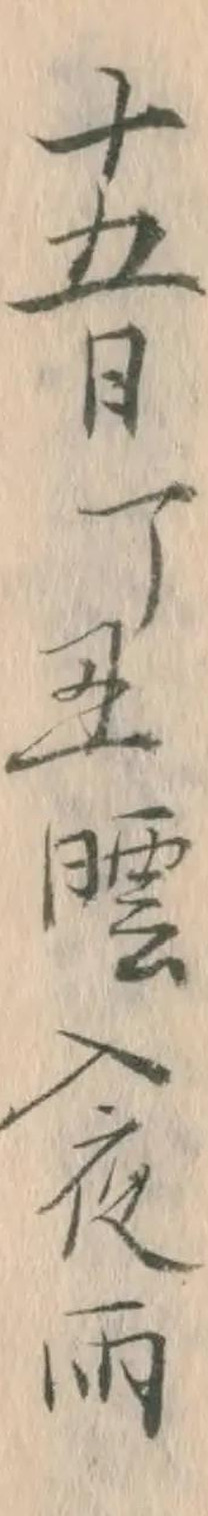十五日丁丑曇入夜雨
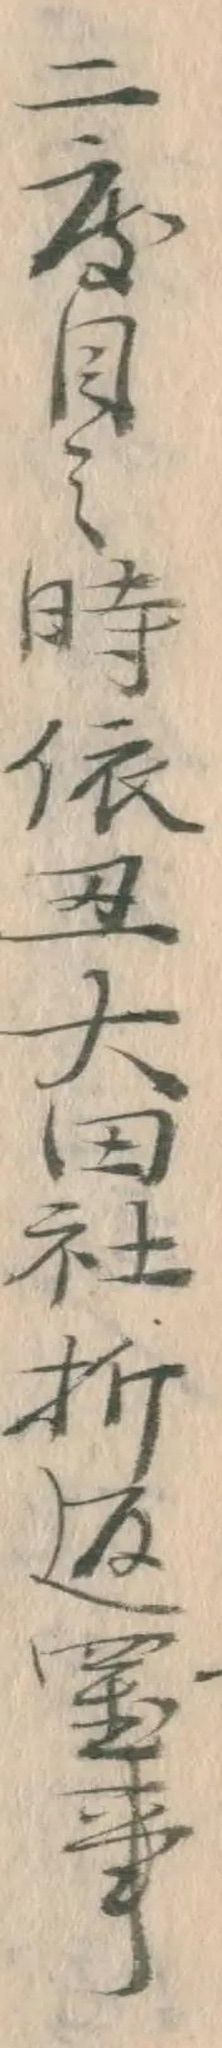二度目之時依丑大田社折返置事
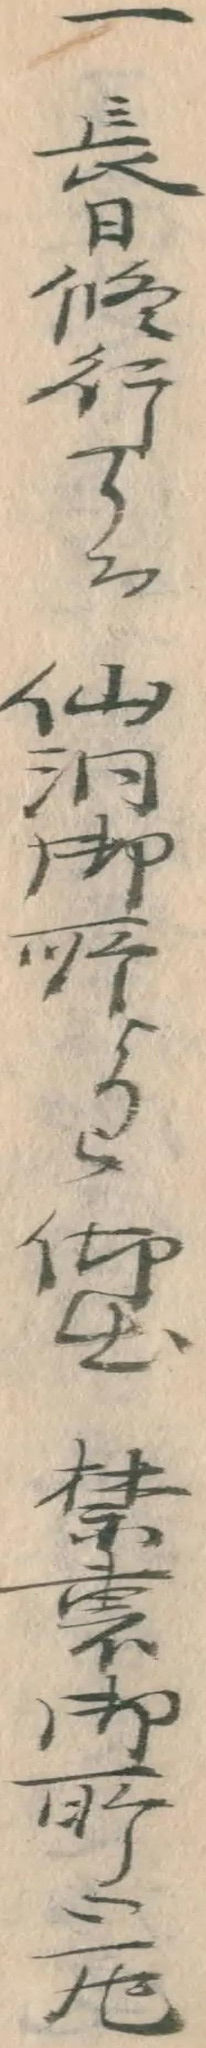一長日修行了而仙洞御所より被仰出禁裏御所御厄
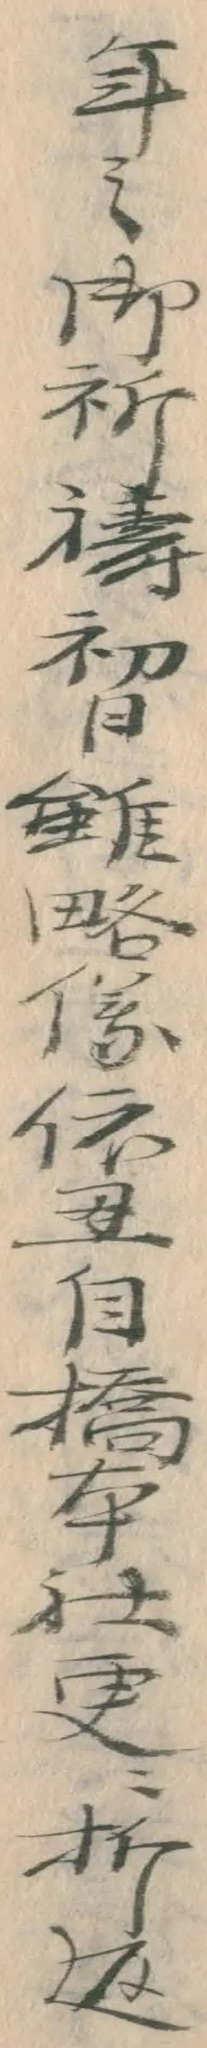年之御祈祷初日雖略儀依丑自橋本社更ニ折返
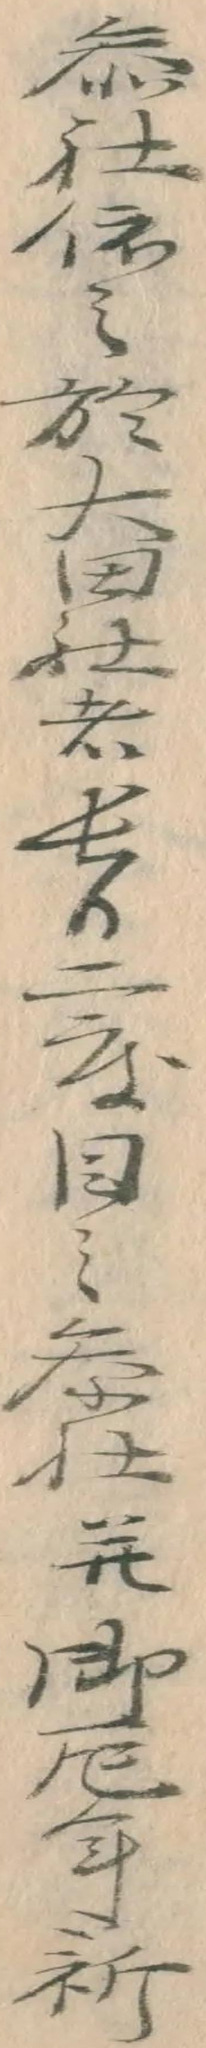参社依之於大田社は長日二度目之参仕并御厄年御祈

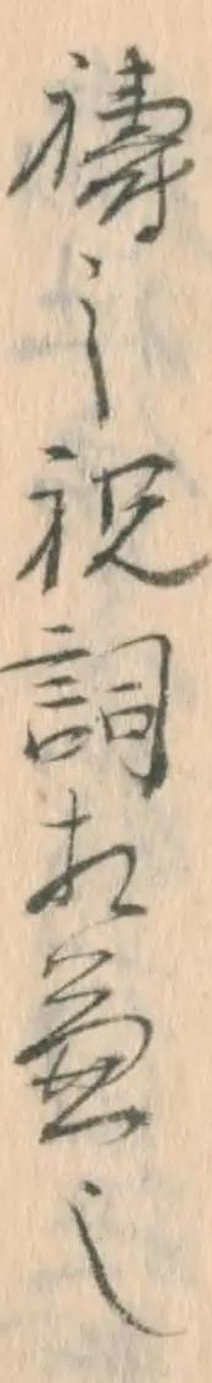祷之祝詞相兼也
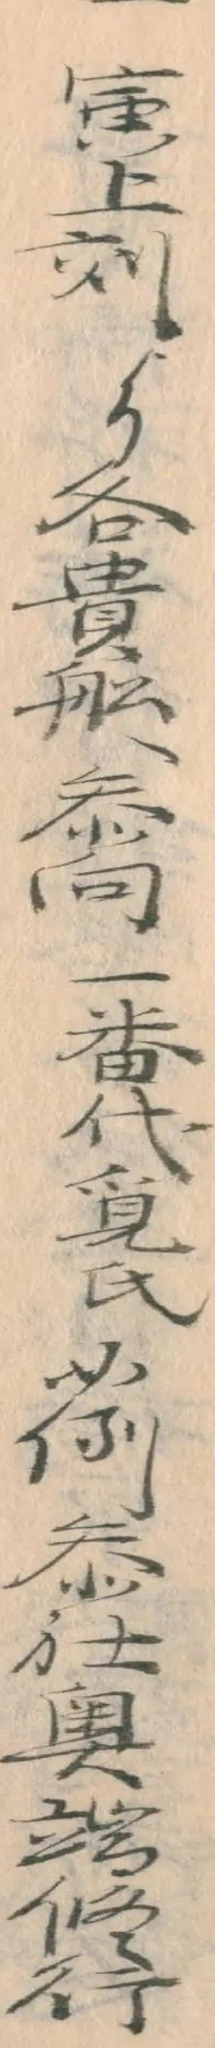一寅上刻より各貴舩へ参向一番代鬼覓氏如例参社奥端修行
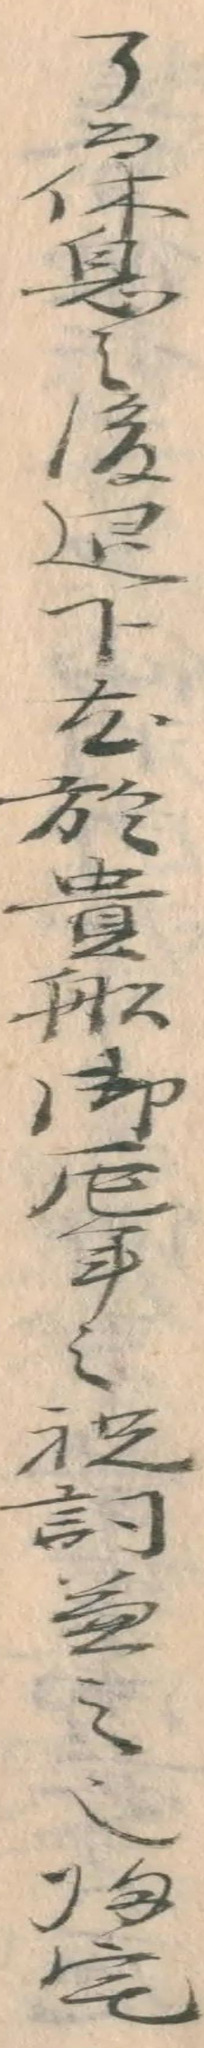了而休息之後退下尤於貴舩御厄年之祝詞兼之也帰宅
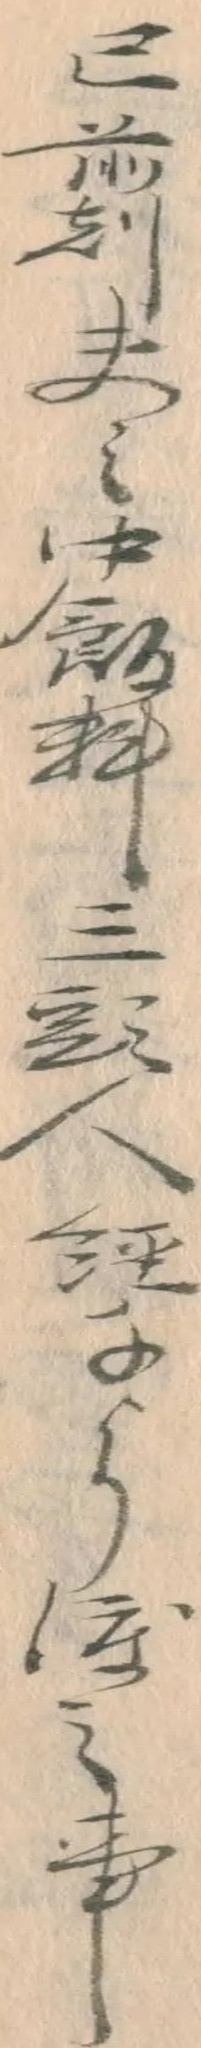已前刻夫之中飯料三頭人経千より渡之事
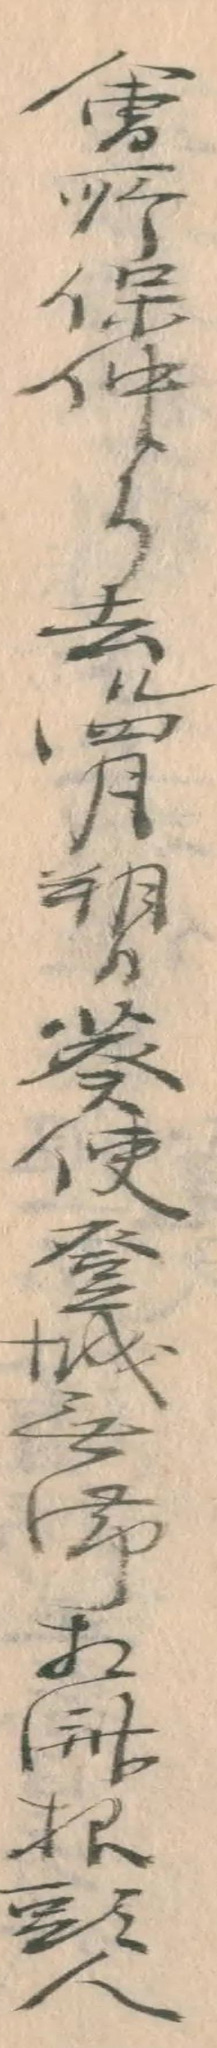一會所保仲より去ル四月朔日葵使登城無滞相済候様頭人
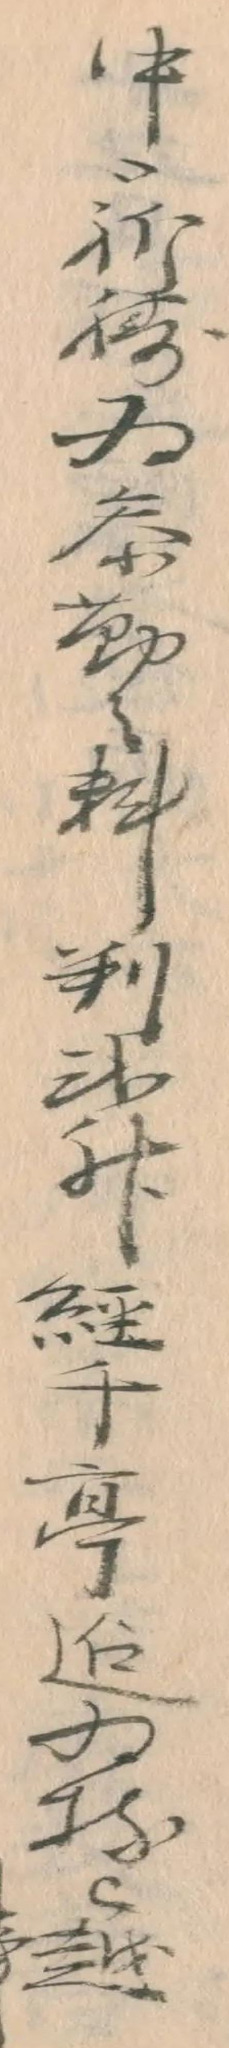中御祈祷為参勤之料判弐升経千亭追為持被越事
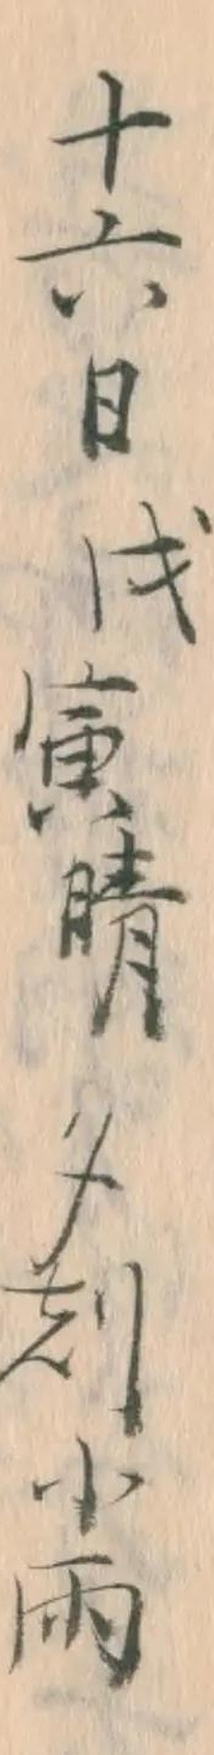十六日戊寅晴夕刻小雨
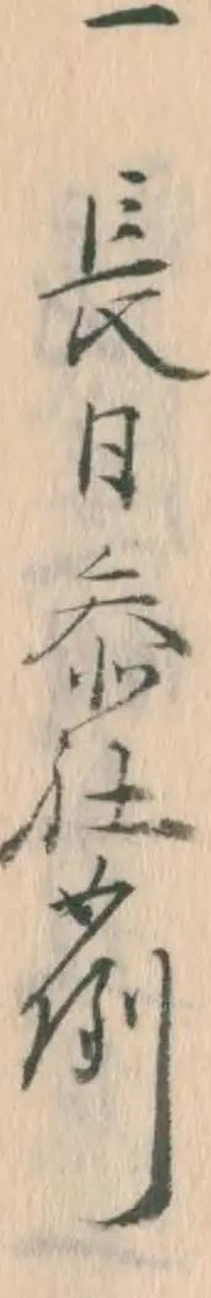一長日参社如例
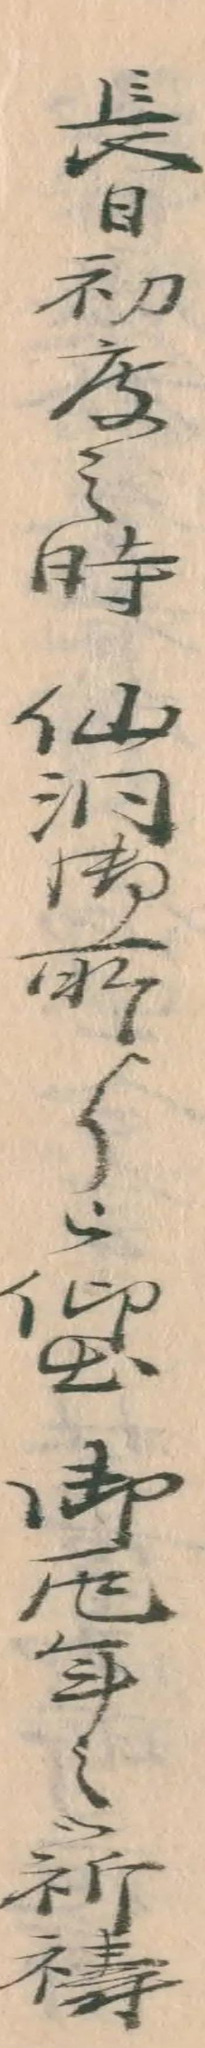一長日初度之時仙洞御所より被仰出御厄年之御祈祷
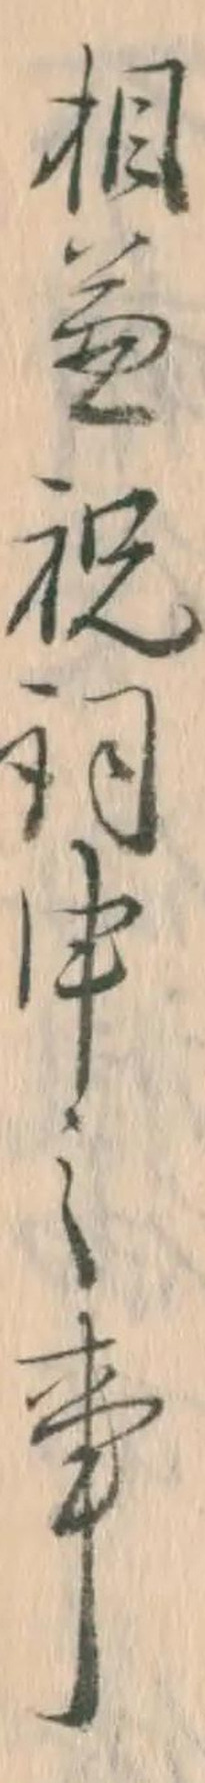相兼祝詞申之事
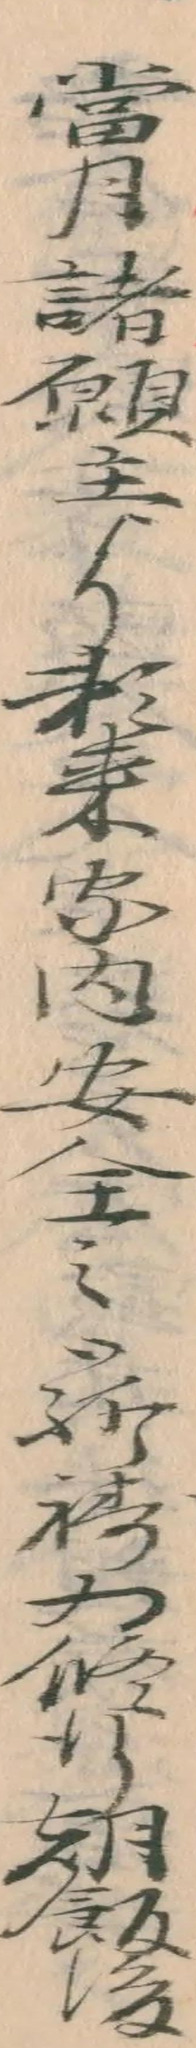一當月諸願主より頼来家内安全之御祈祷為修行朝飯後
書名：賀茂社記録. 第73冊
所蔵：国立国会図書館 National Diet Library, JAPAN
